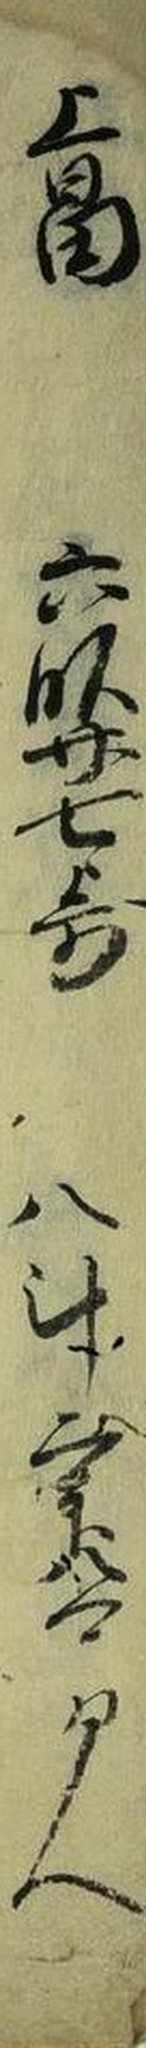上畠六畝廿七歩八斗二升八合同人
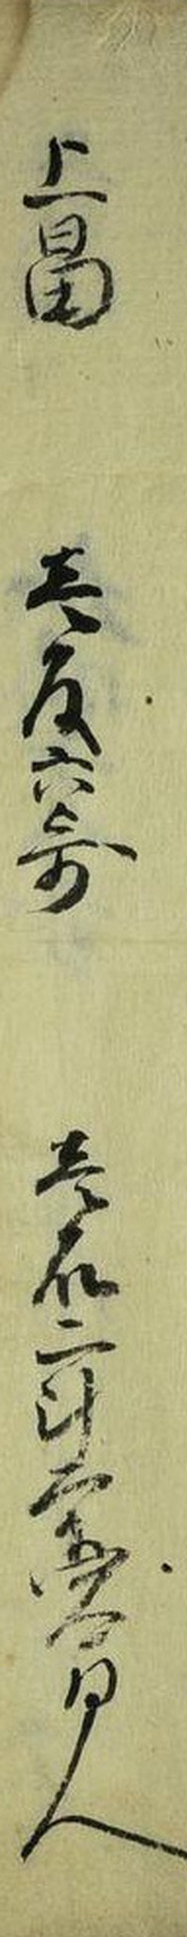上畠壱反六歩壱石二斗二升四合同人
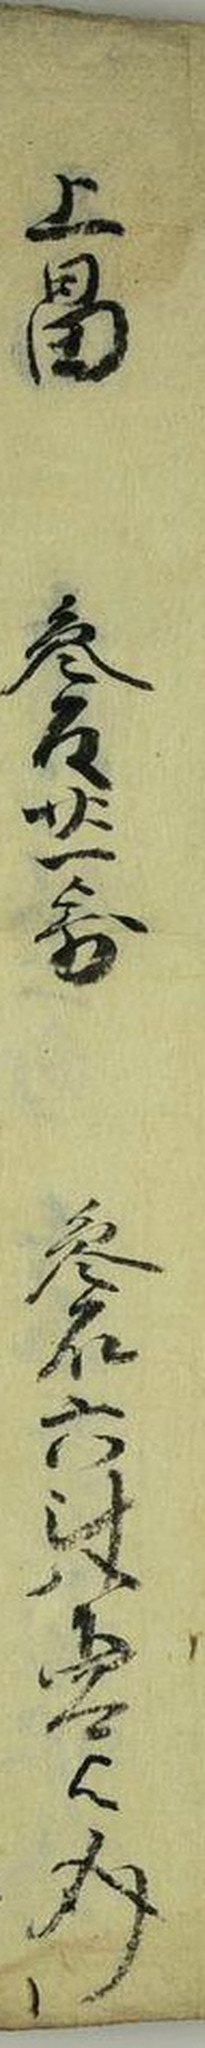上畠参反廿一歩三石六斗八升四合とみ
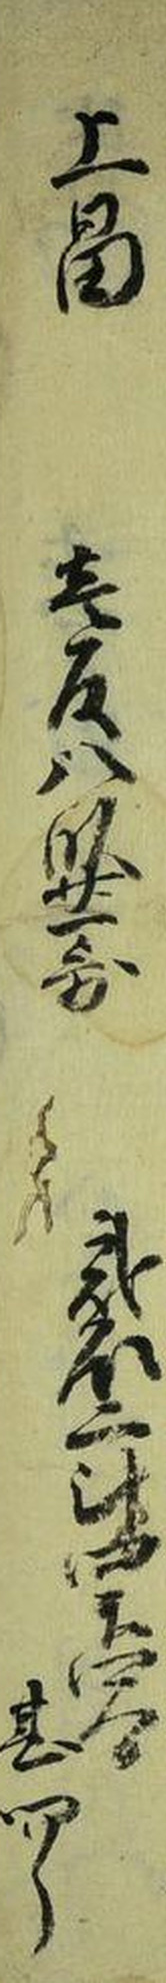上畠壱反八畝廿一歩弐石二斗四升四合甚四郎
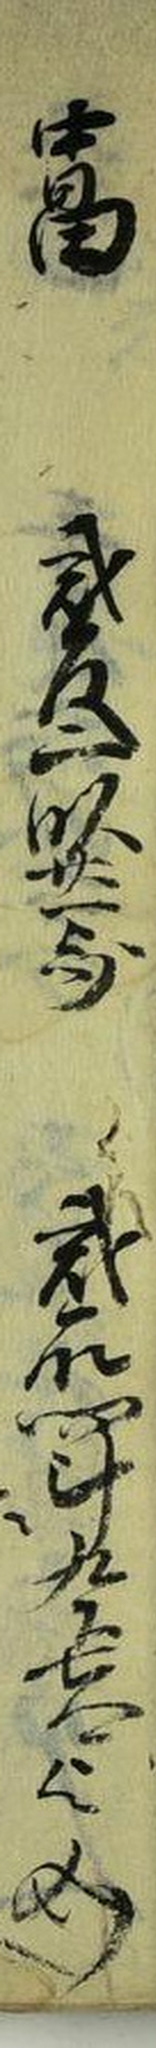中畠弐反二畝廿一歩弐石四斗九升七合とみ
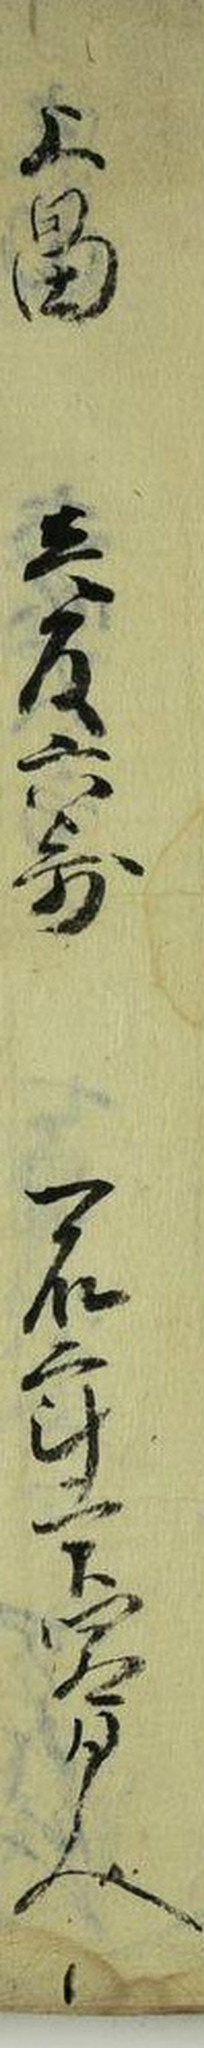上畠壱反六歩一石二斗二升四合同人
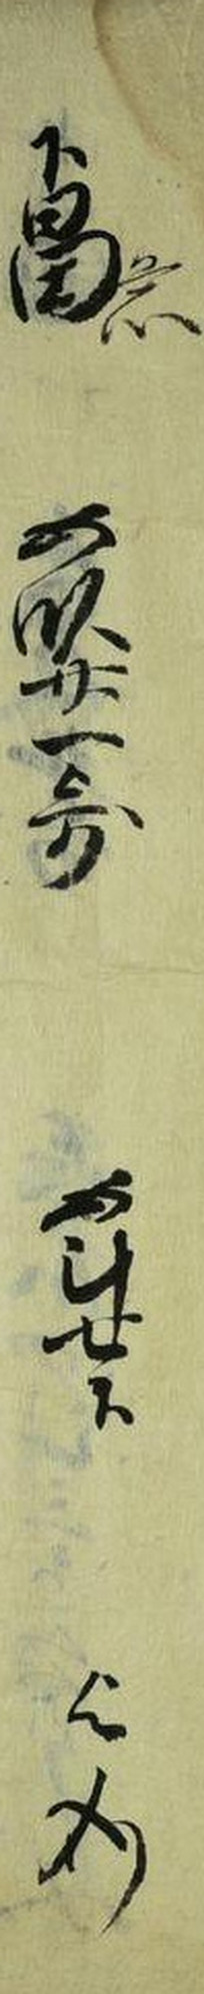下畠五畝廿一歩五斗七升とみ
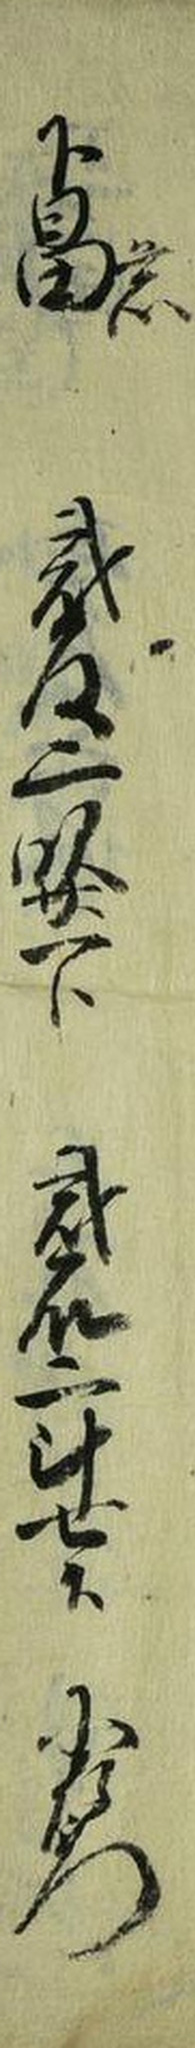下畠弐反二畝廿一歩弐石二斗七升小左衛門
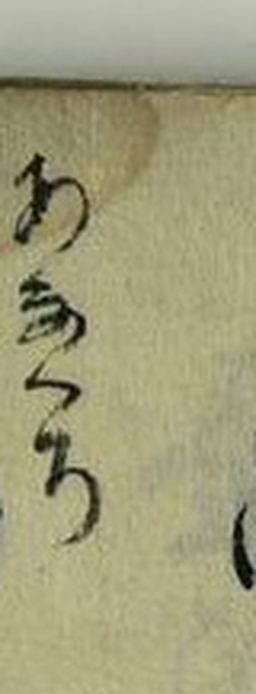あなくろ

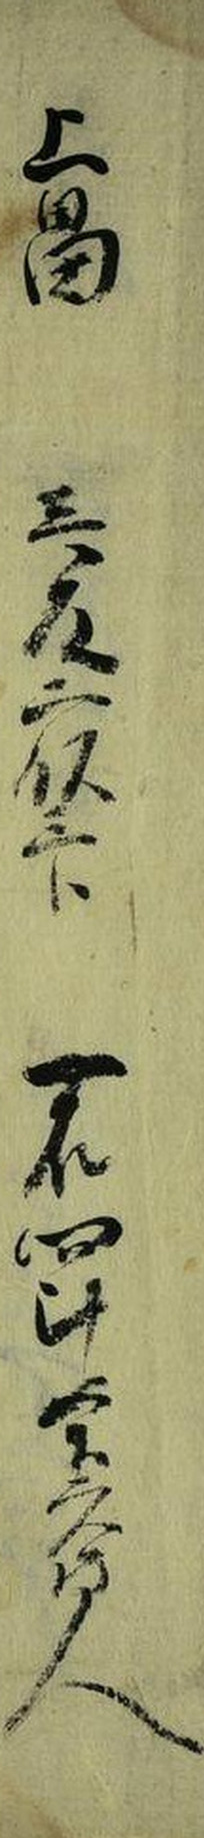上畠壱反二畝三歩壱石四斗五升二合同人
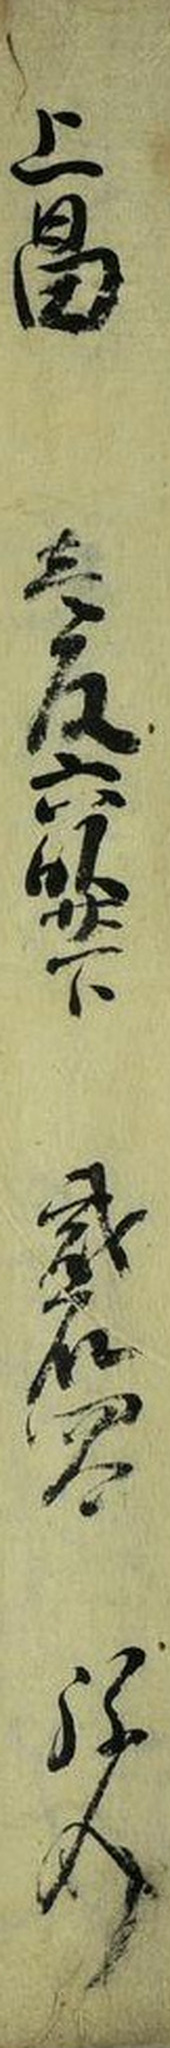上畠壱反六畝廿一歩弐石四合弥介
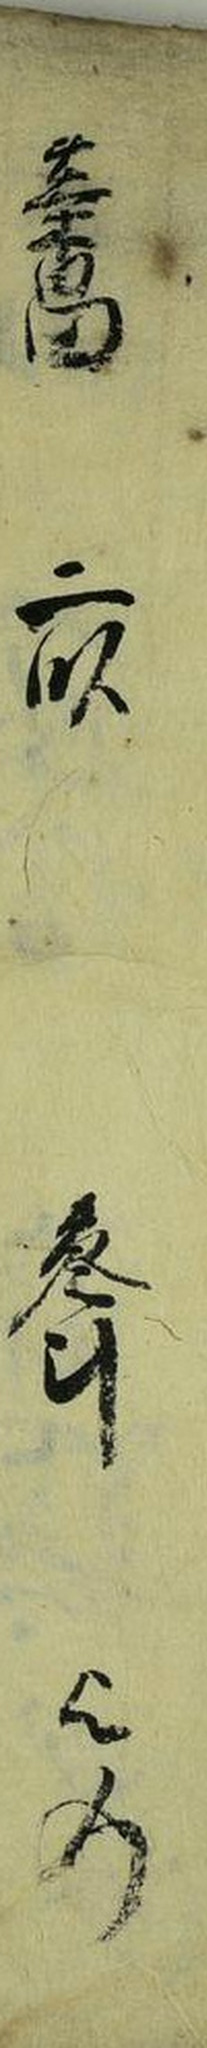桑畠二畝参斗とみ
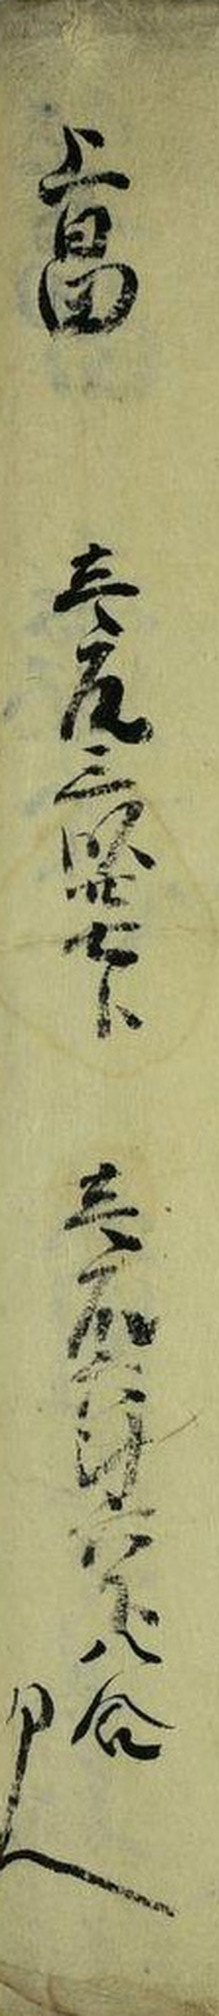上畠壱反三畝廿七歩壱石六斗六升八合同人
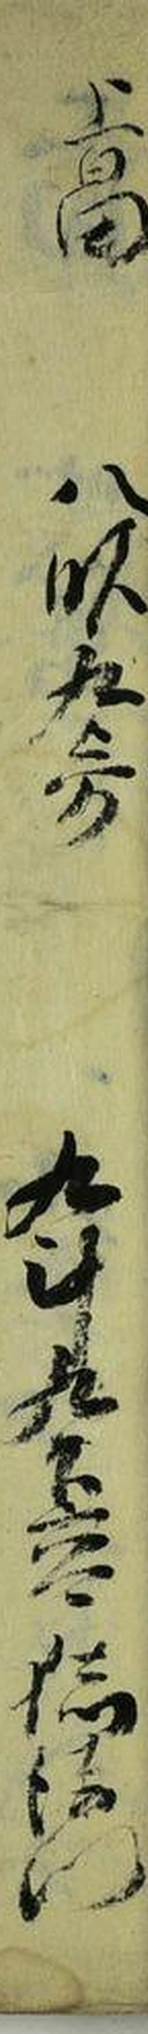上畠八畝九歩九斗九升六合信衛門
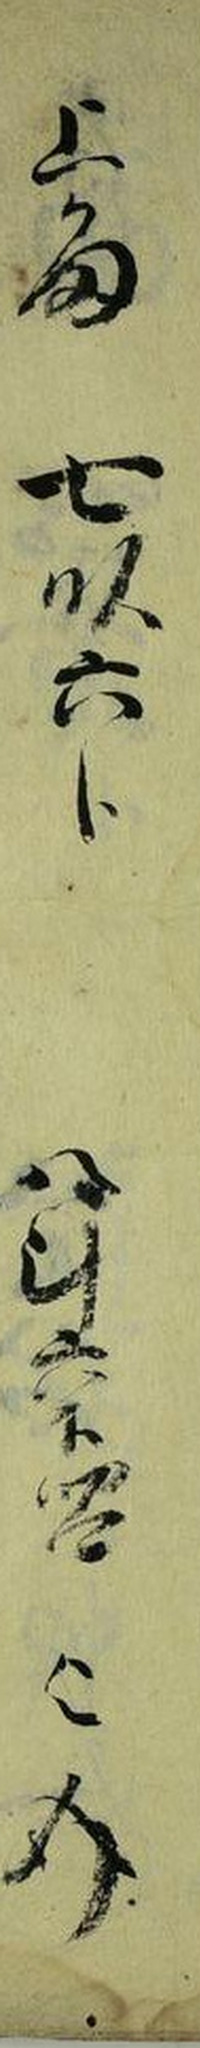上畠七畝六歩八斗六升四合とみ
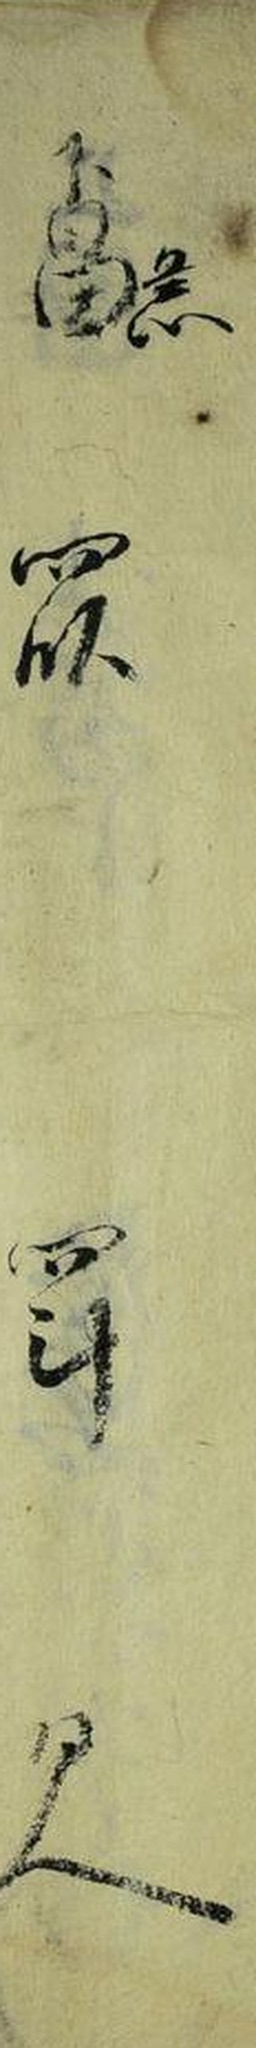下畠四畝四斗同人
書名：越前国中墨郡安沢村水帳（太閤検地帳）
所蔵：福井県文書館 Fukui Prefectural Archives
